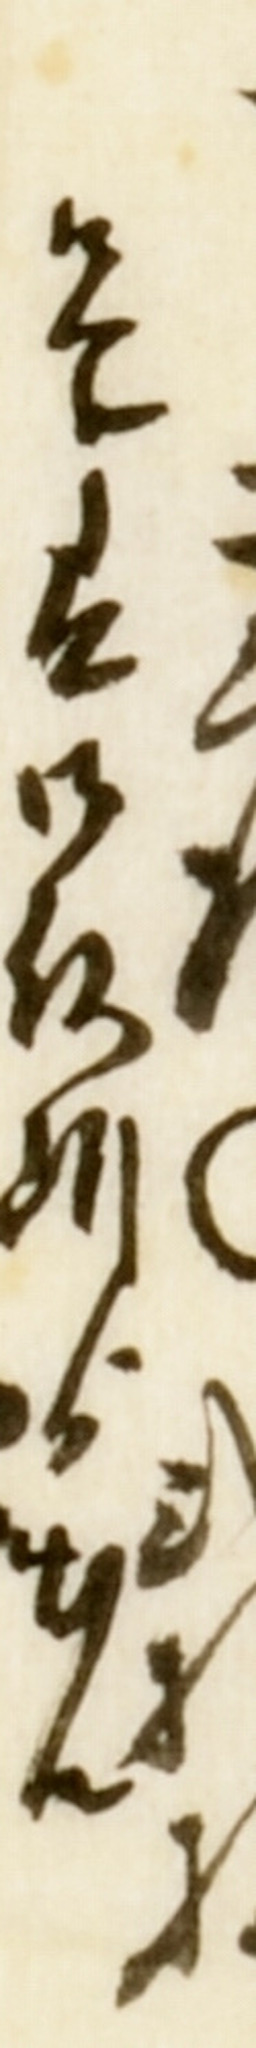是は御役所ゟ出ル
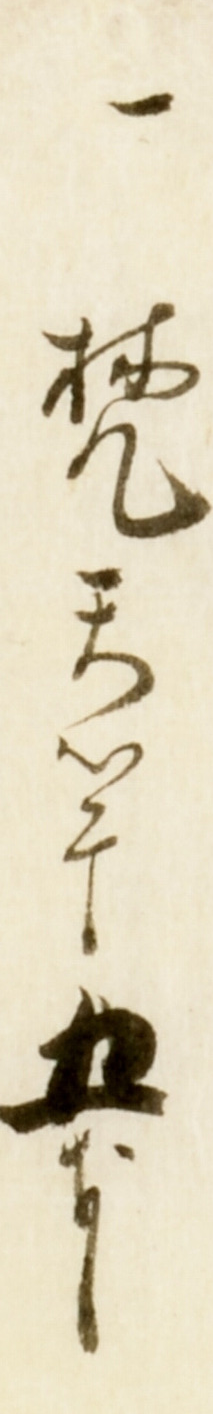一梵天竿五本
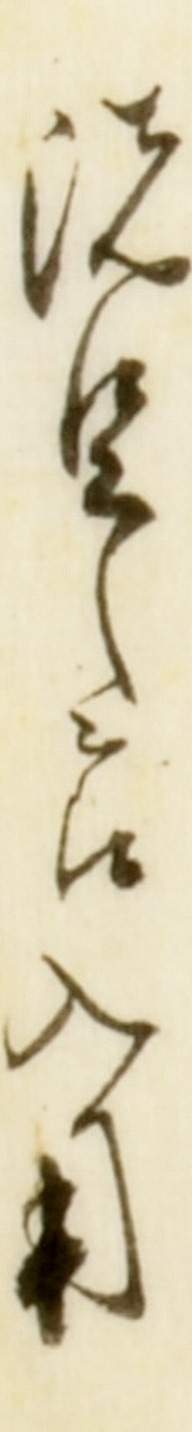洗足之節入用

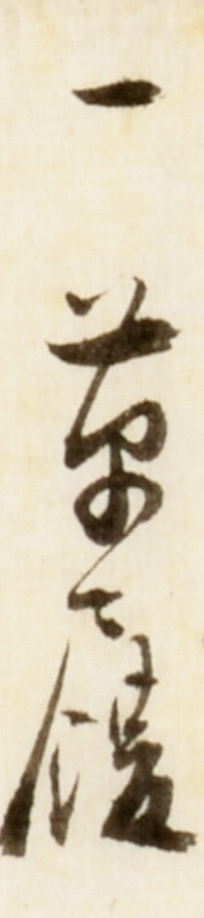一草履
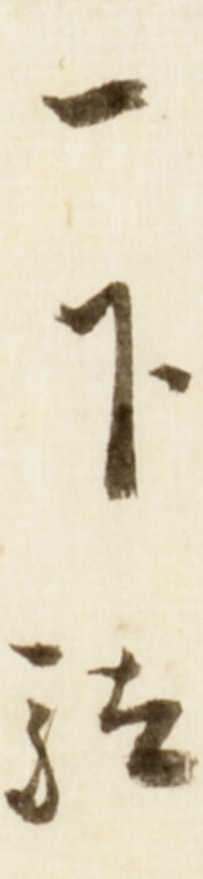一下駄
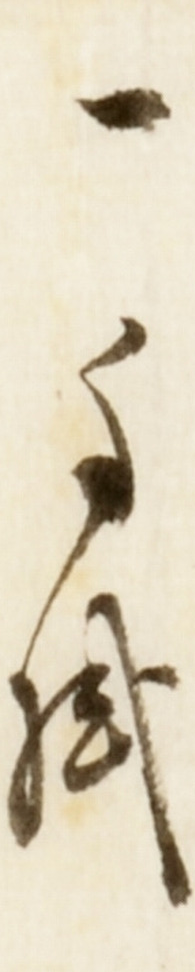一手拭
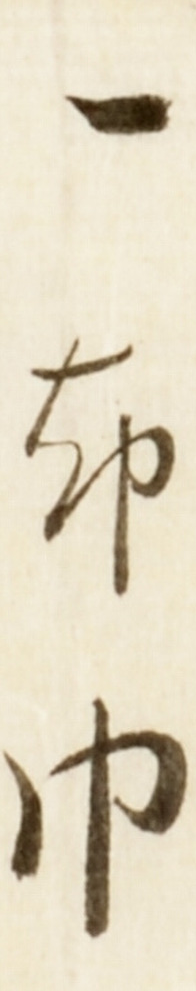一布巾
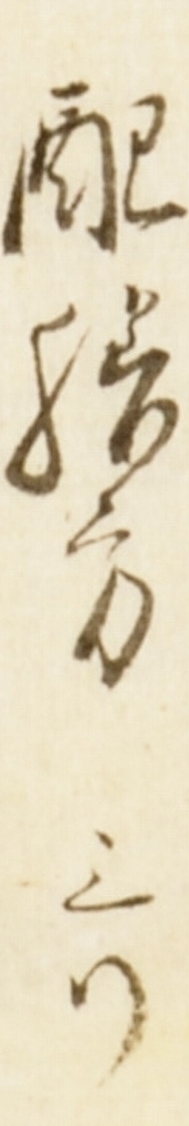配膳方三ツ
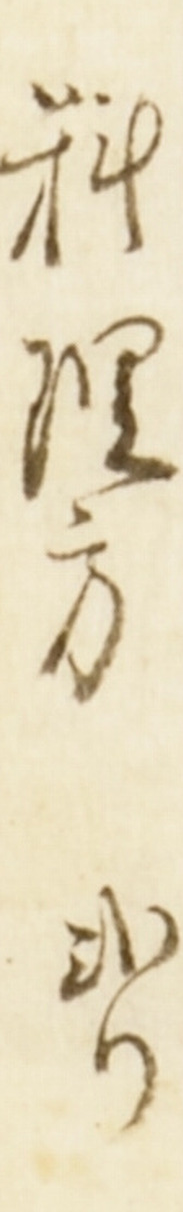料理方弐ツ
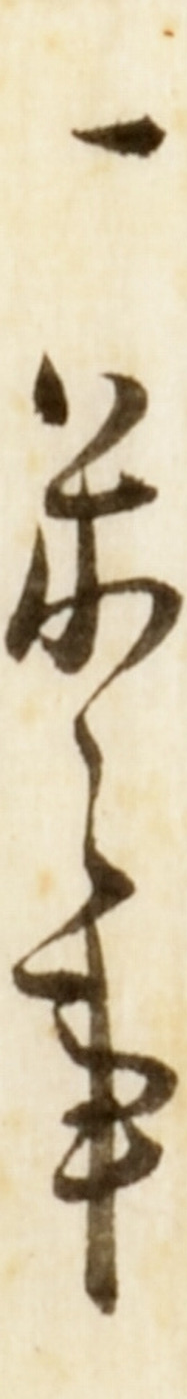一米之事
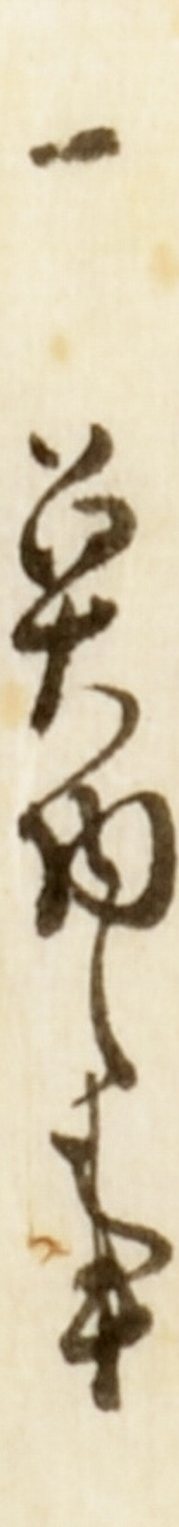一魚物之事
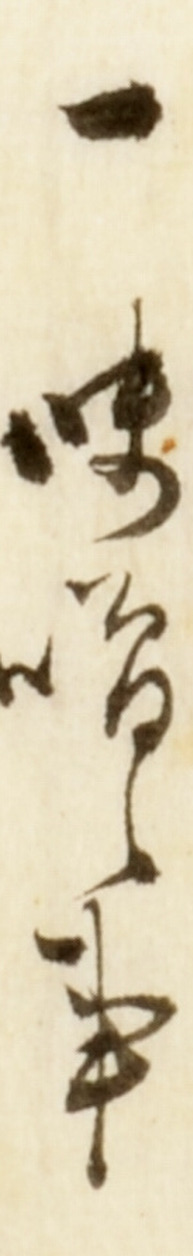一味噌之事
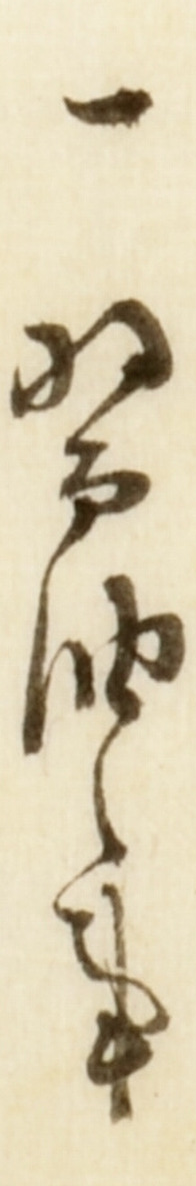一醤油之事
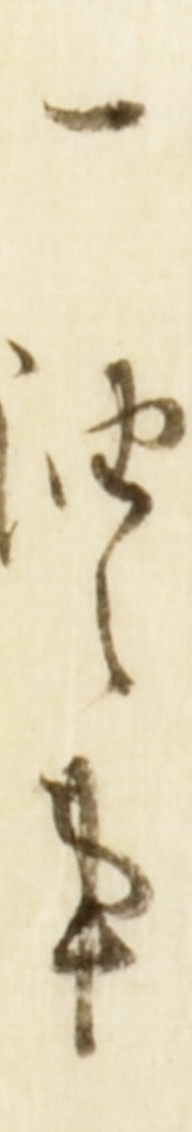一油之事
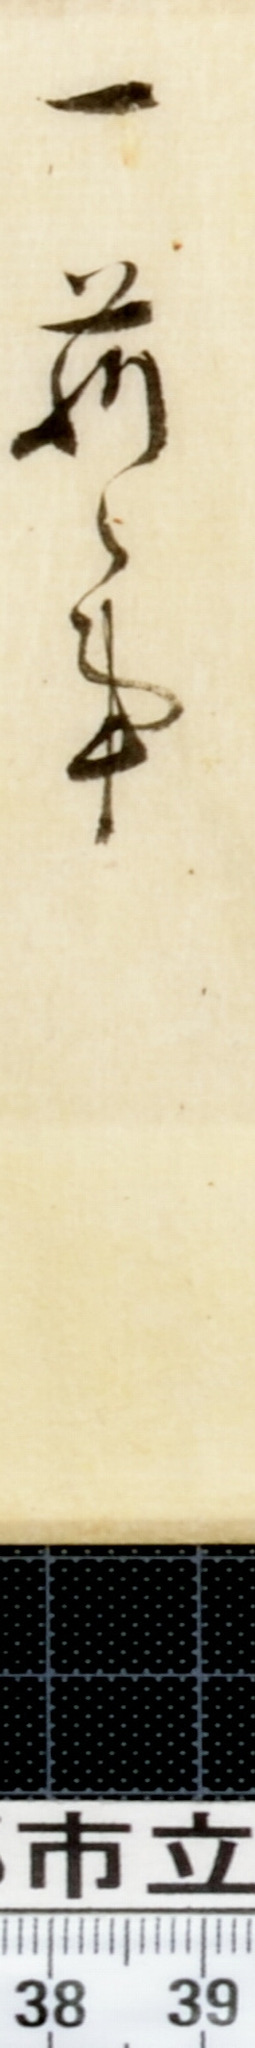一米之事
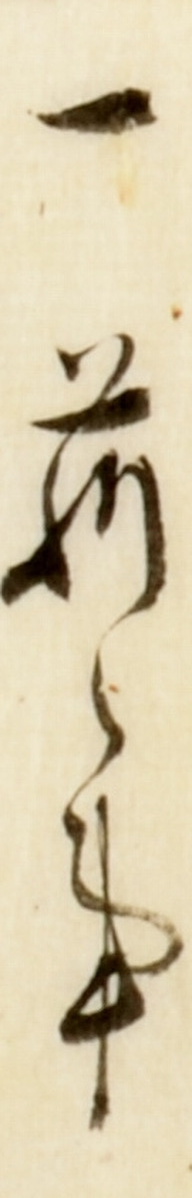一米之事
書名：覚
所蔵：伊那市立高遠町図書館・合同会社AMANE
